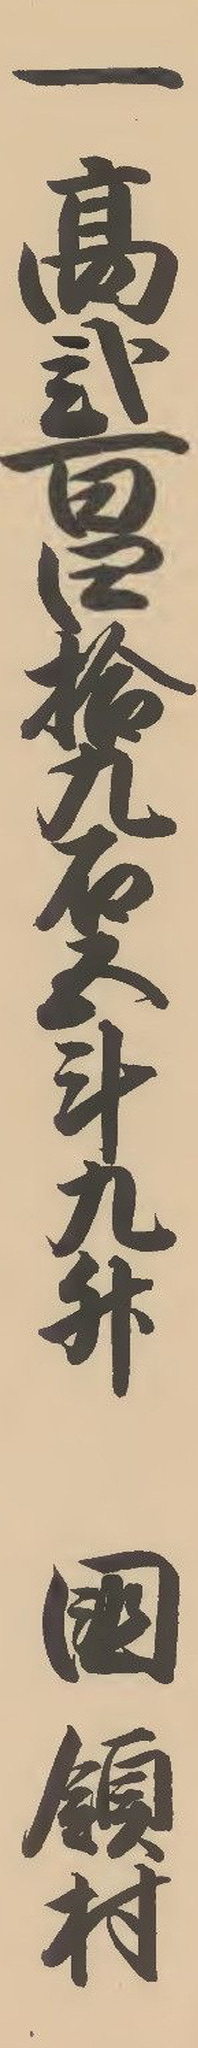一髙弐百四拾九石五斗九升国領村
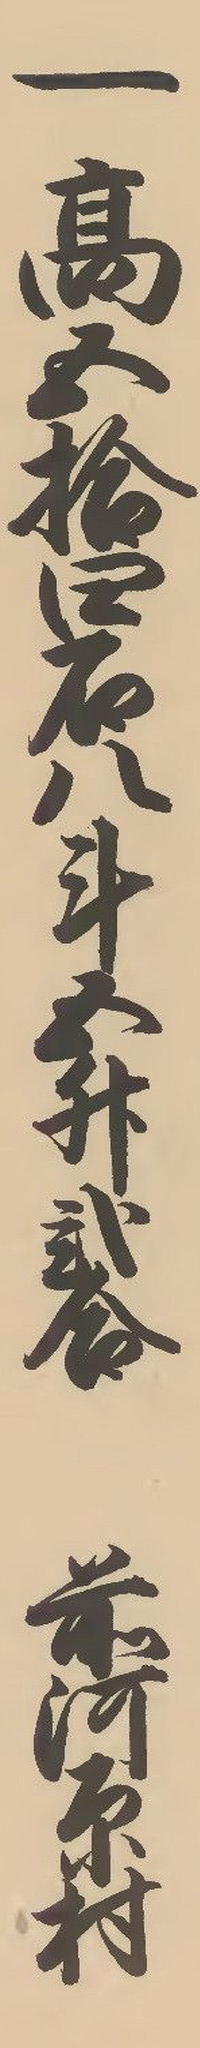一髙五拾四石八斗五升弐合前河原村

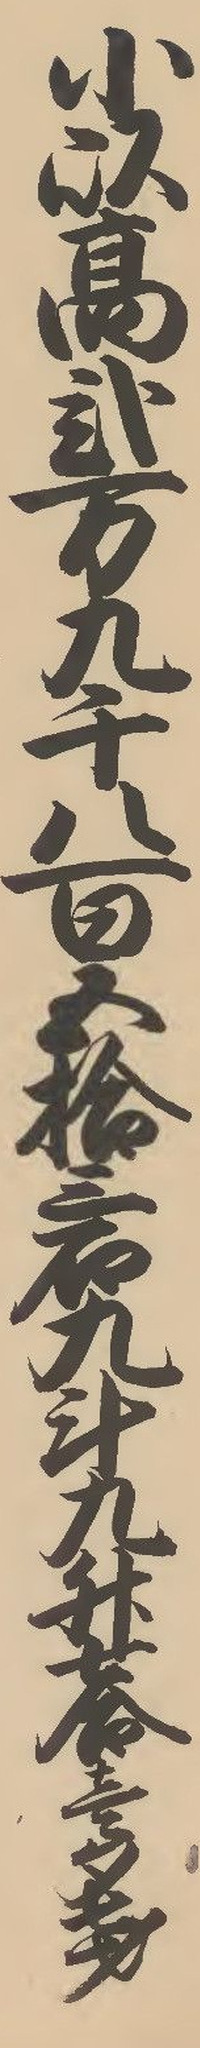小以髙弐万九千八百五拾三石九斗九升七合壱夕七才
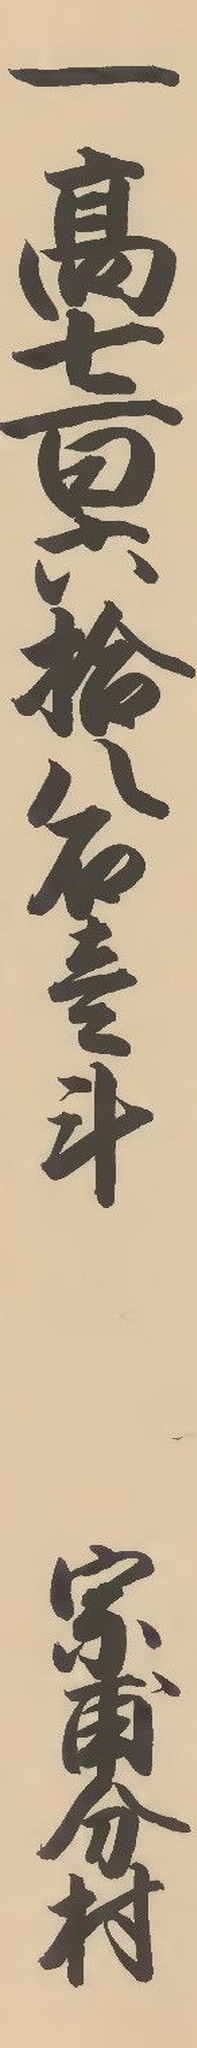一髙七百六拾八石壱斗宗甫分村
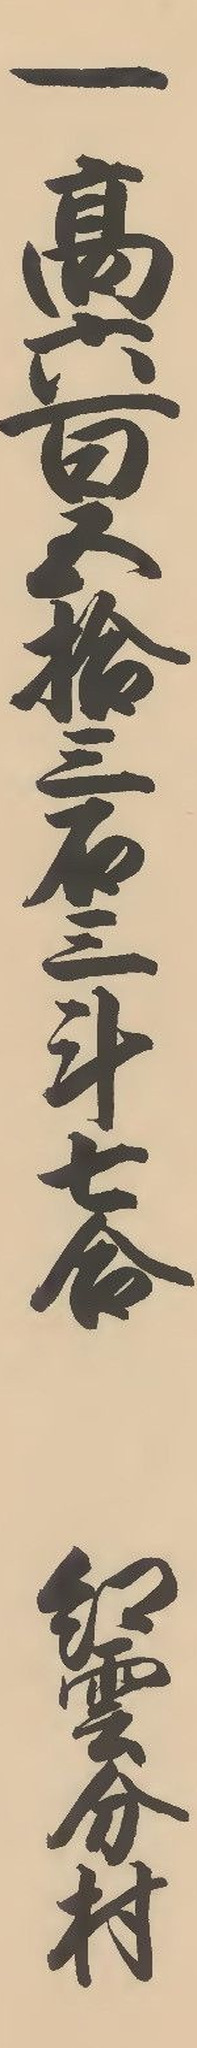一髙六百五拾三石三斗七合紅雲分村
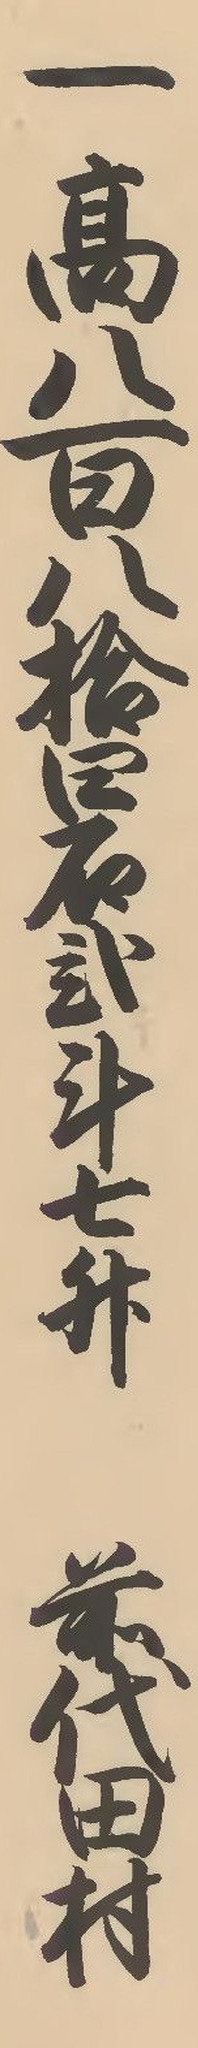一髙八百八拾四石弐斗七升前代田村

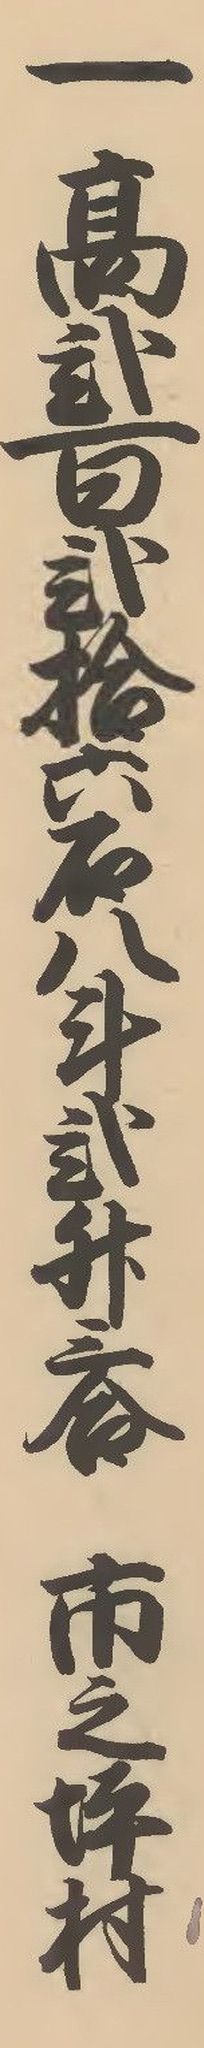一髙弐百弐拾六石八斗弐升三合市之坪村
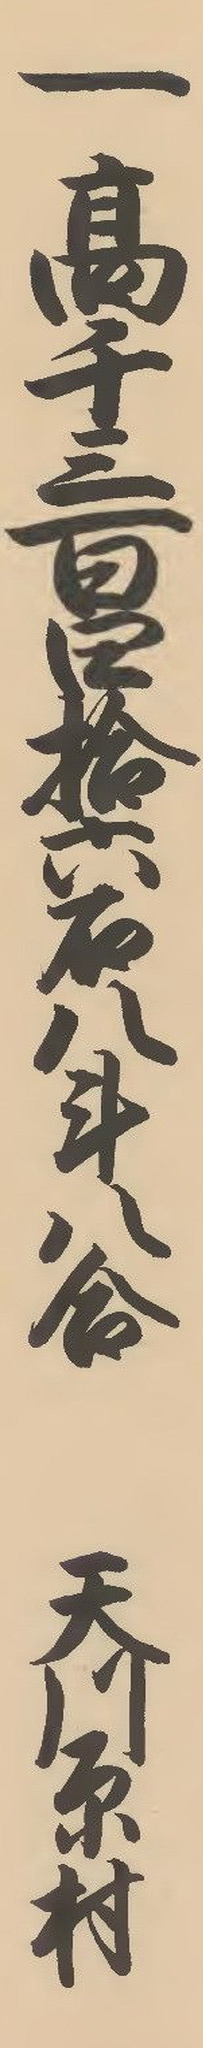一髙千三百四拾六石八斗八合天川原村
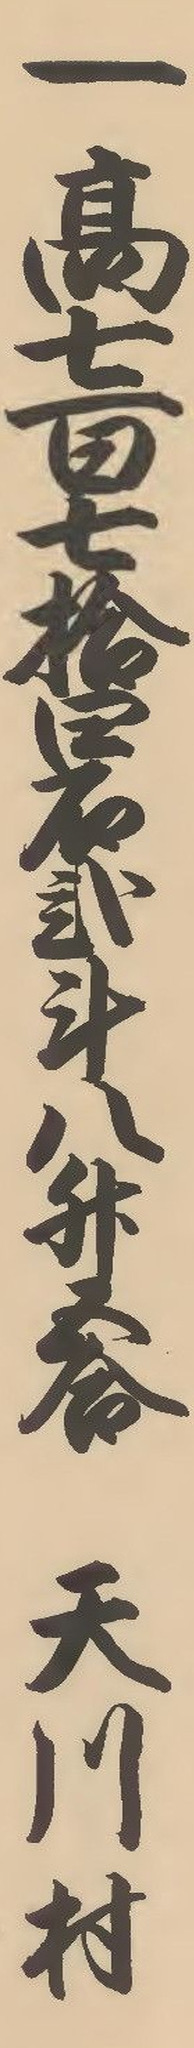一髙七百七拾四石弐斗八升五合天川村
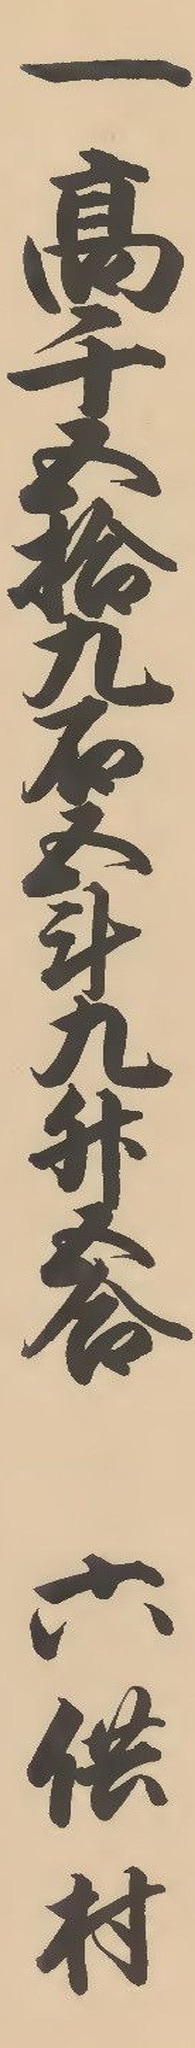一髙千五拾九石五斗九升五合六供村
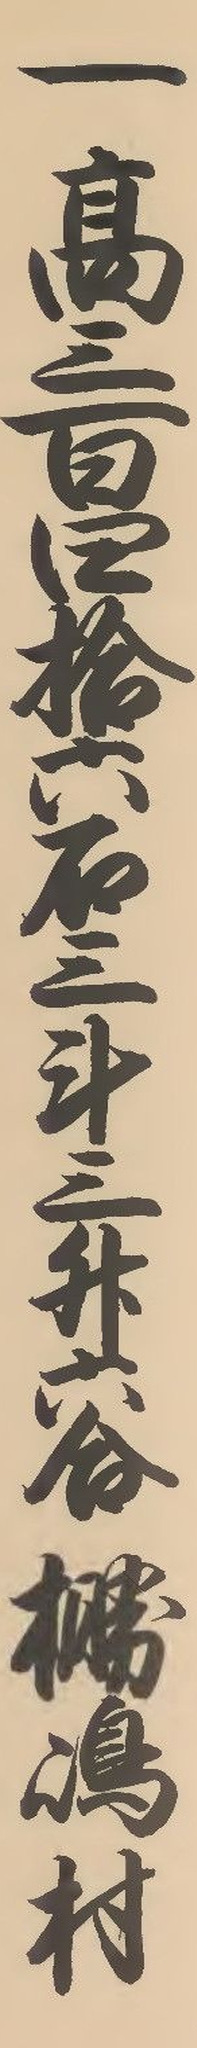一髙三百四拾六石三斗三升六合橳嶋村
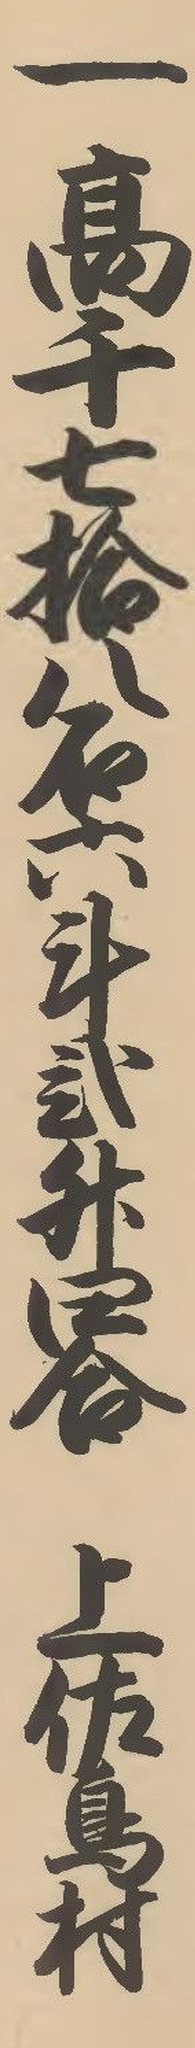一髙千七拾八石六斗弐升四合上佐鳥村
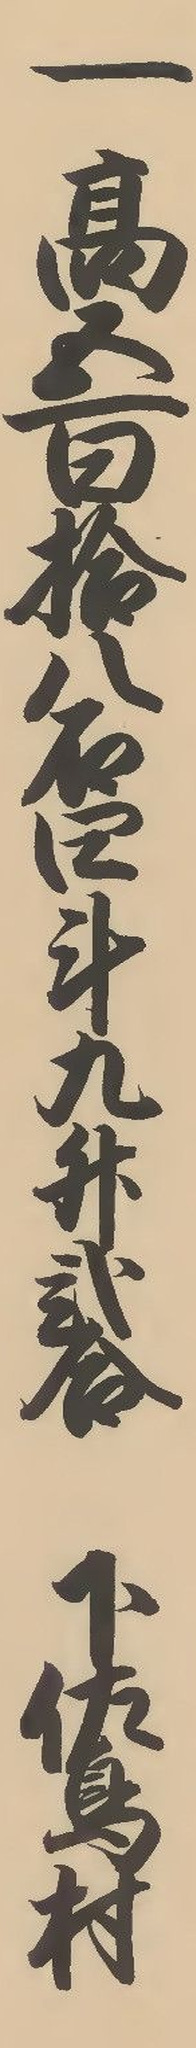一髙五百拾八石四斗九升弐合下佐鳥村
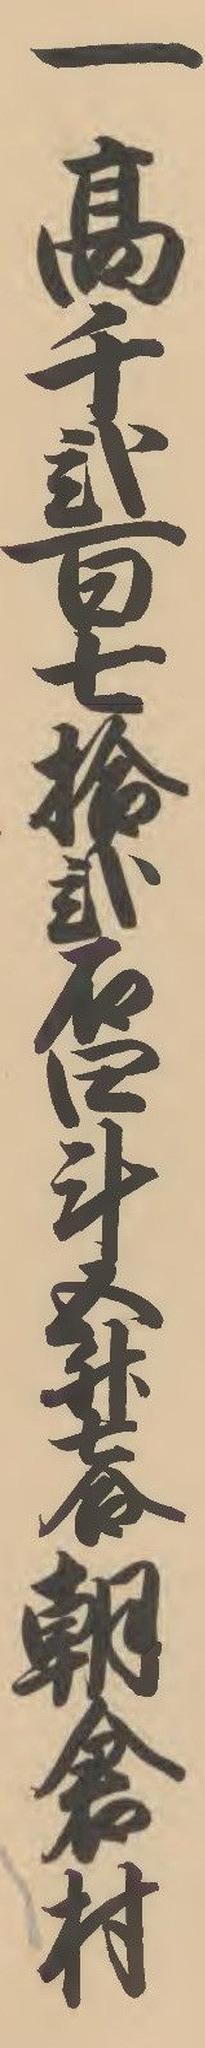一髙千弐百七拾弐石四斗五升七合朝倉村

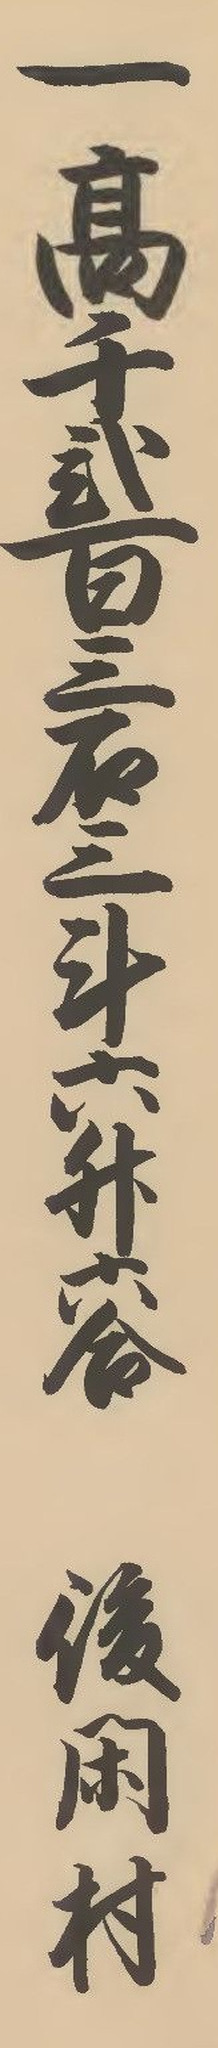一髙千弐百三石三斗六升六合後閑村
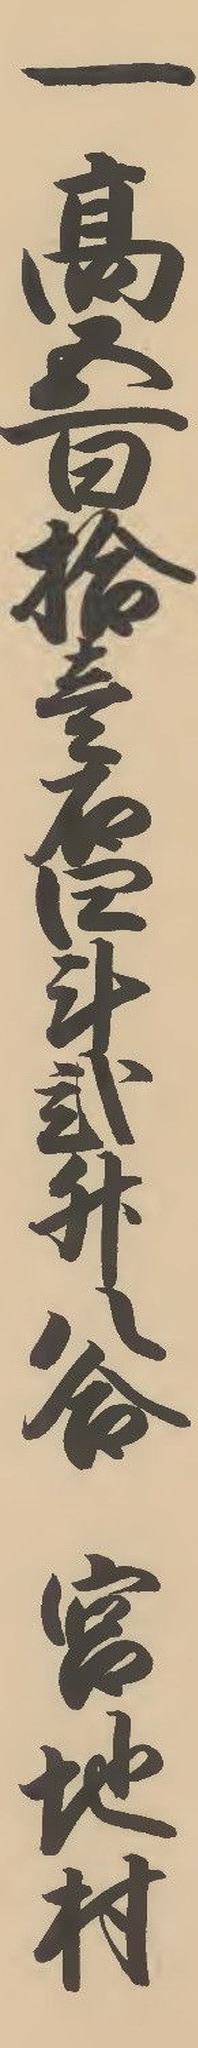一髙五百拾壱石四斗弐升八合宮地村
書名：上野国郷帳
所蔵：国立公文書館 National Archives of Japan
